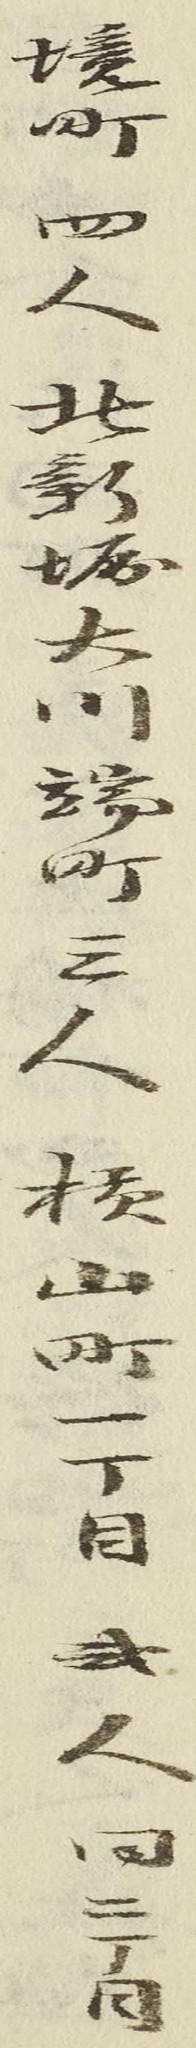境町四人北新堀大川端町三人横山町一丁目弐人同二丁目
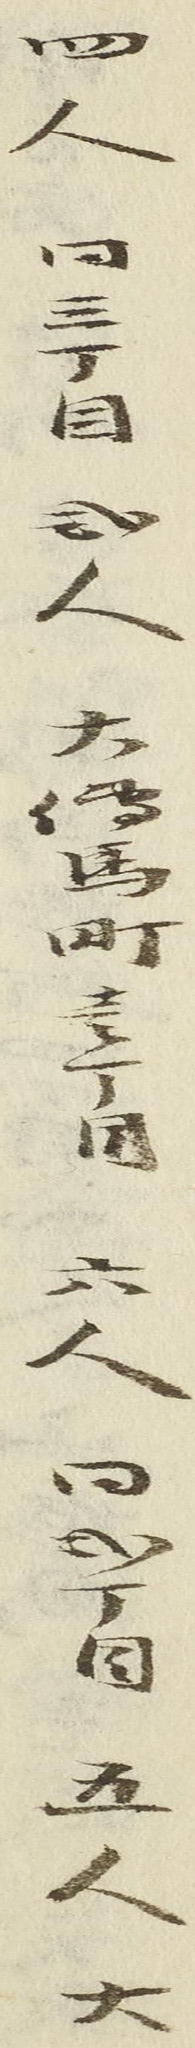四人同三丁目弐人大伝馬町壱丁目六人同弐丁目五人大
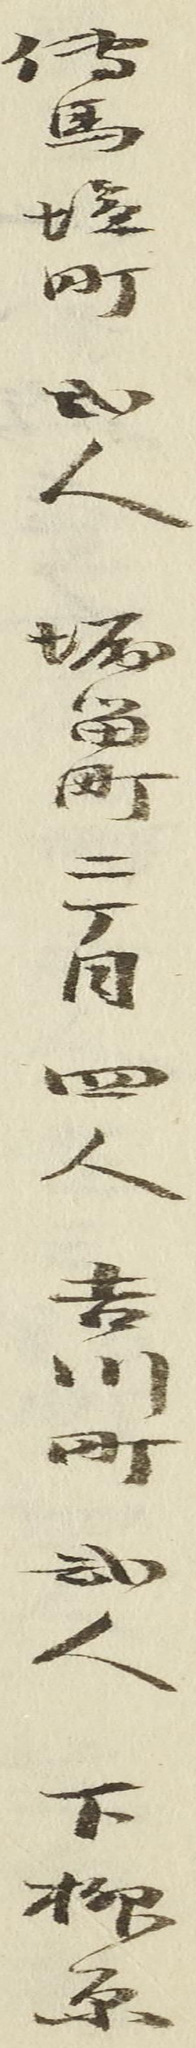伝馬塩町弐人堀留町二丁目四人吉川町弐人下柳原
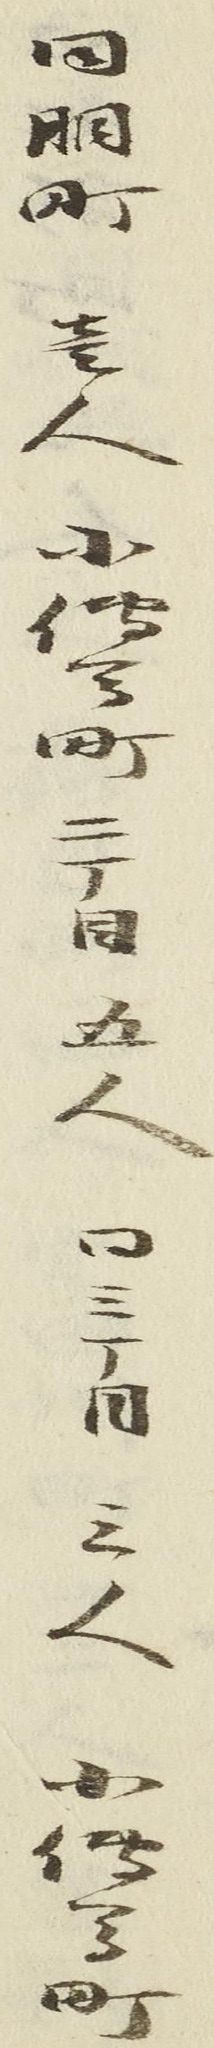同朋町壱人小伝馬町二丁目五人同三丁目三人小伝馬町
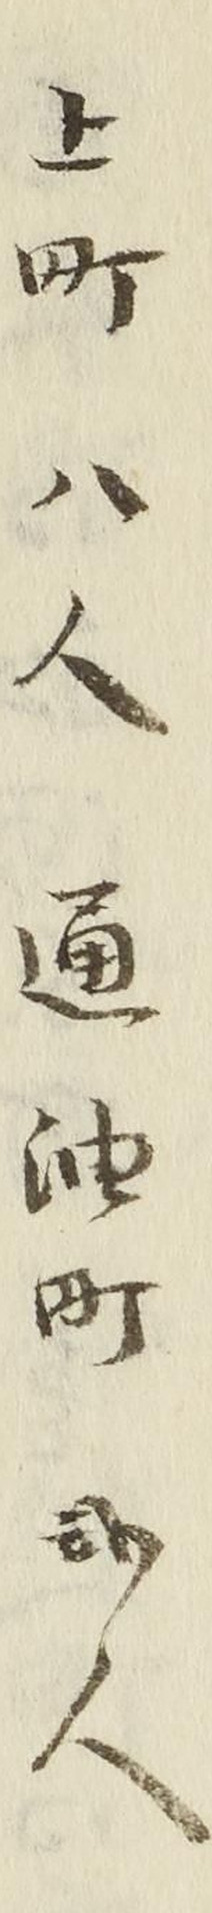上町八人通油町弐人
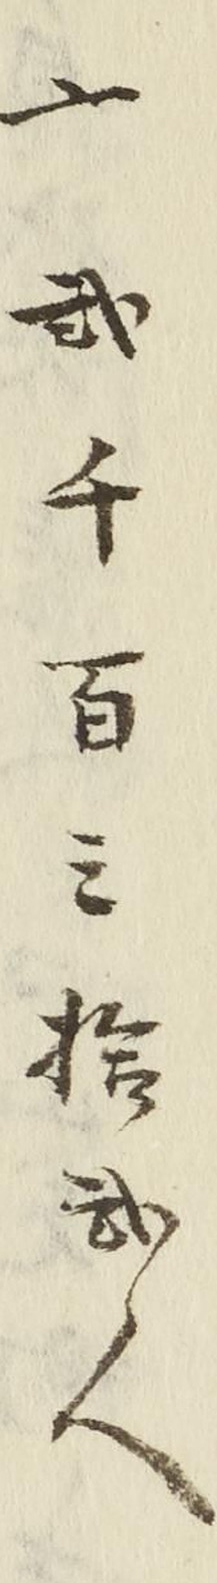〆弐千百三拾弐人
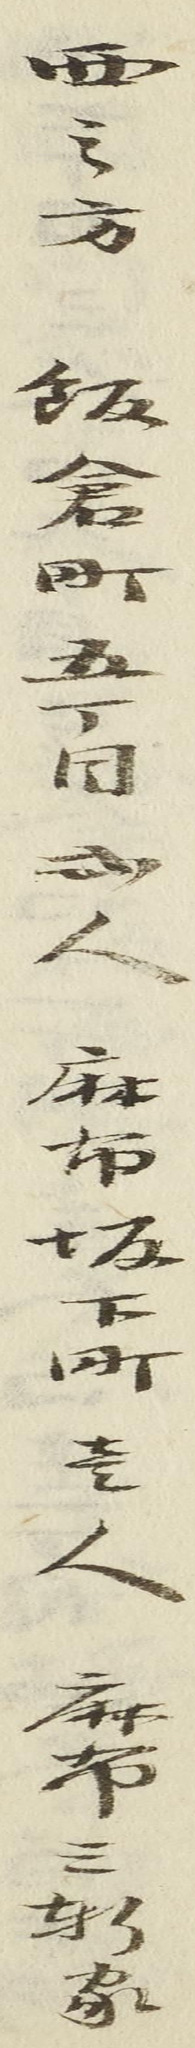西之方飯倉町五丁目弐人麻布坂下町壱人麻布三軒家
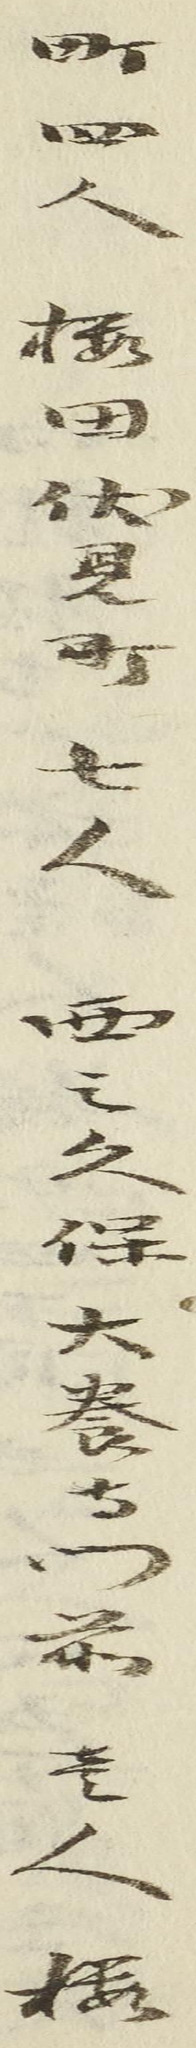町四人桜田伏見町七人西之久保大養寺門前壱人桜
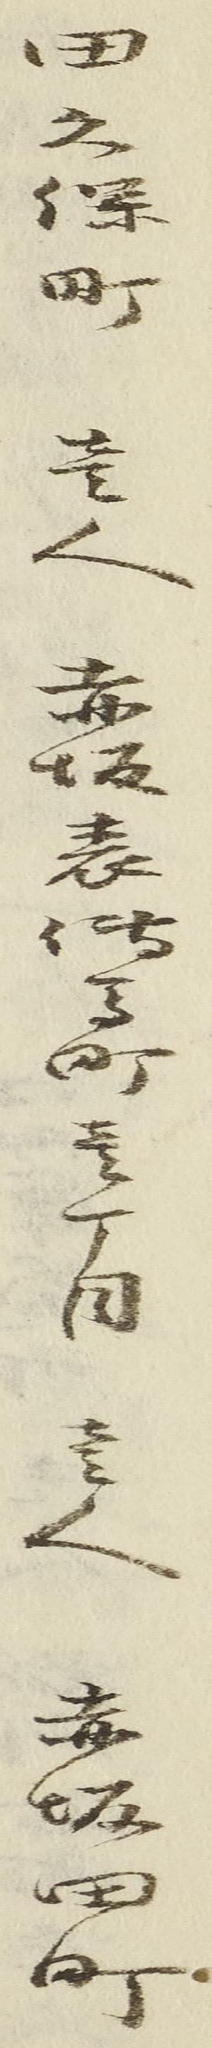田久保町壱人赤坂表伝馬町壱丁目壱人赤坂田町
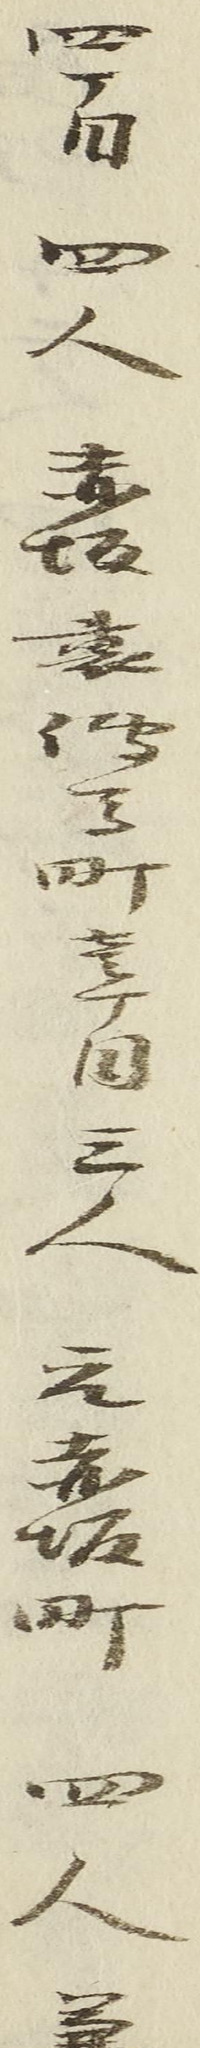四丁目四人赤坂裏伝馬町壱丁目三人元赤坂町四人兼

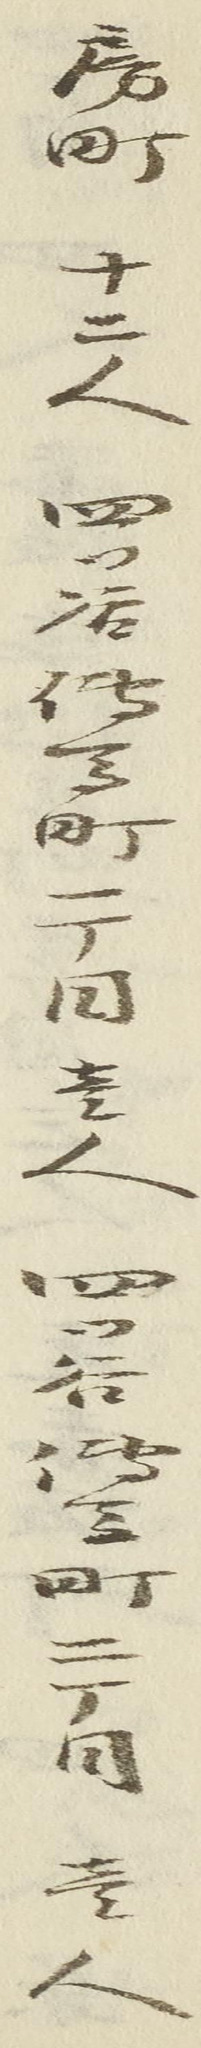房町十二人四ッ屋伝馬町一丁目壱人四ッ屋伝馬町二丁目壱人
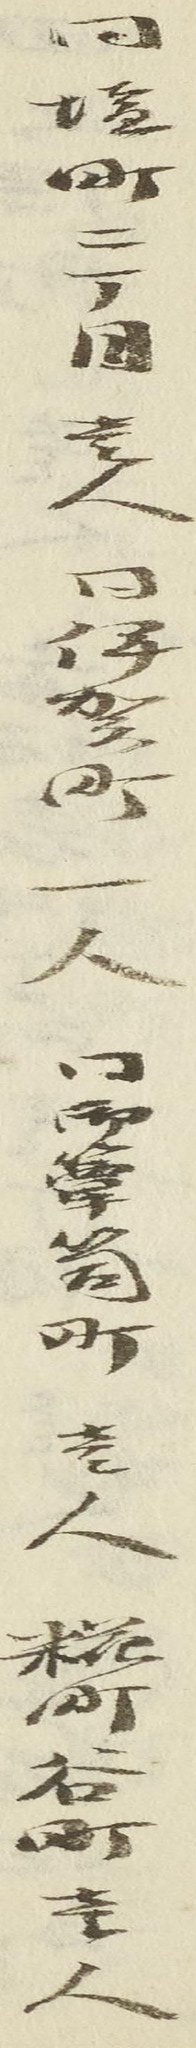同塩町二丁目壱人同伊賀町一人同御箪笥町壱人糀町谷町壱人
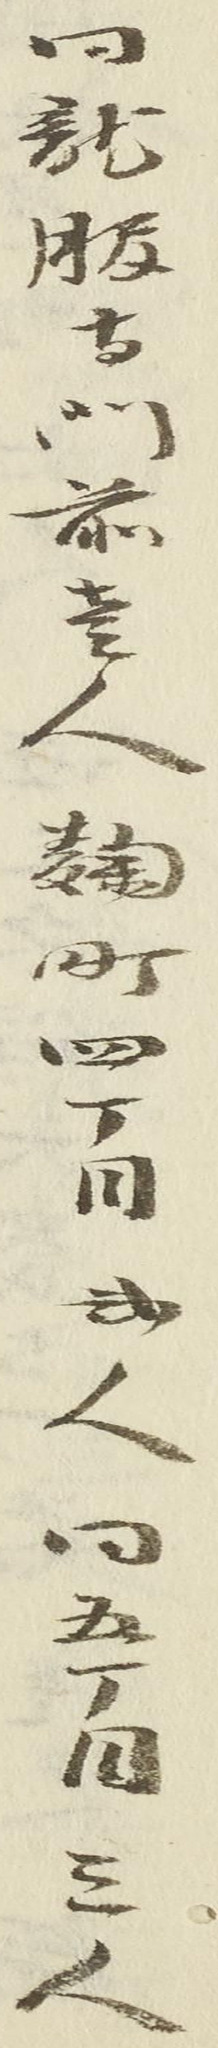同龍勝寺門前壱人麹町四丁目弐人同五丁目三人
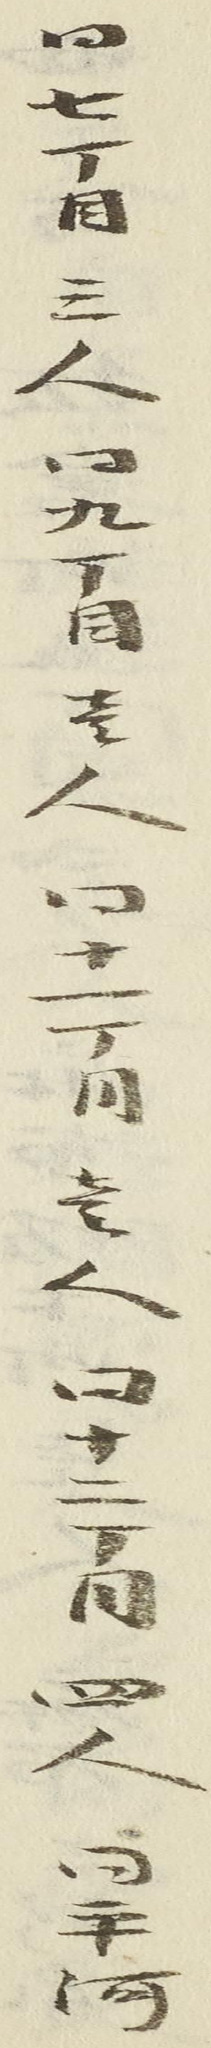同七丁目三人同九丁目壱人同十一丁目壱人同十二丁目四人同平河
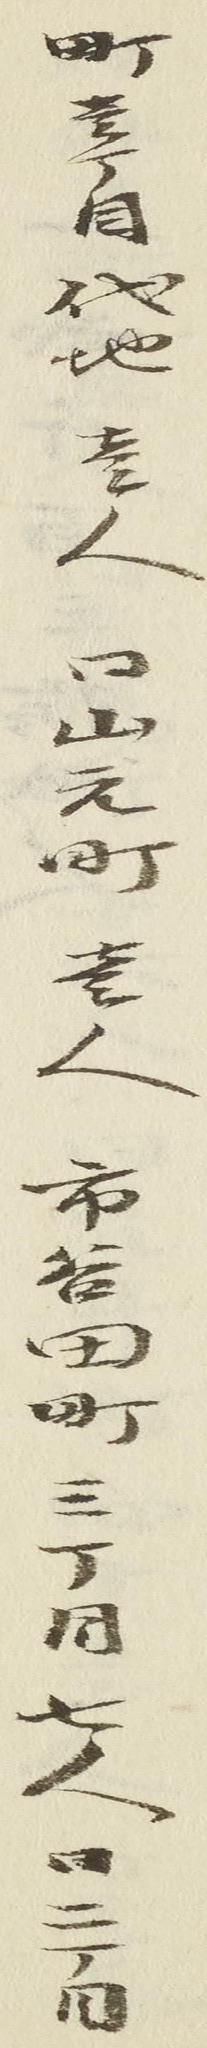町壱丁目代地壱人同山元町壱人市谷田町三丁目七人同二丁目
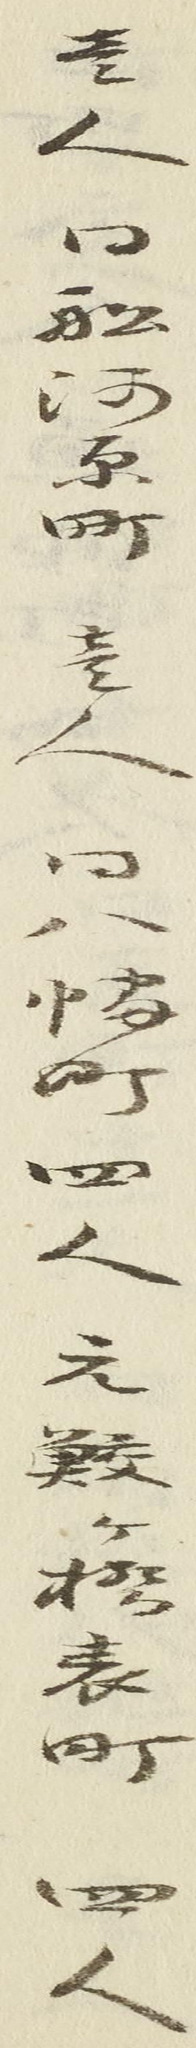壱人同船河原町壱人同八幡町四人元鮫ヶ橋表町四人
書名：那為の後見艸　全
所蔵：東京大学地震研究所図書室 Earthquake Research Institute Library, The University of Tokyo, JAPAN
